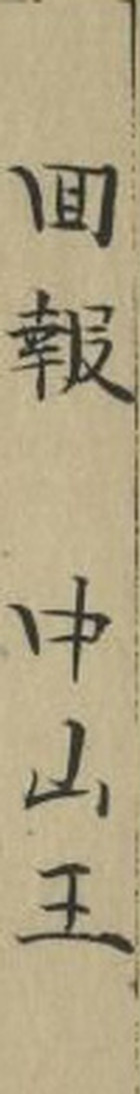回報中山王
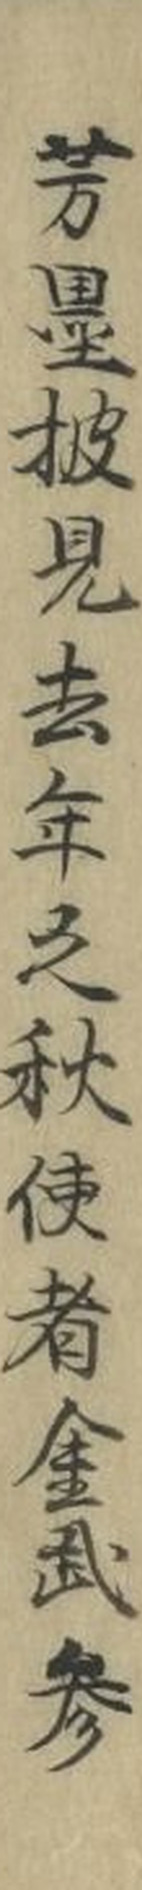芳墨披見去年之秋使者金武参
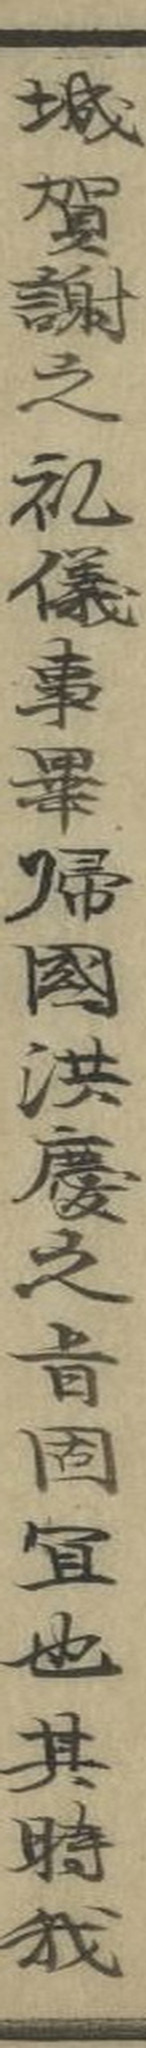城賀謝之礼儀事畢帰国洪慶之旨固冝其時我
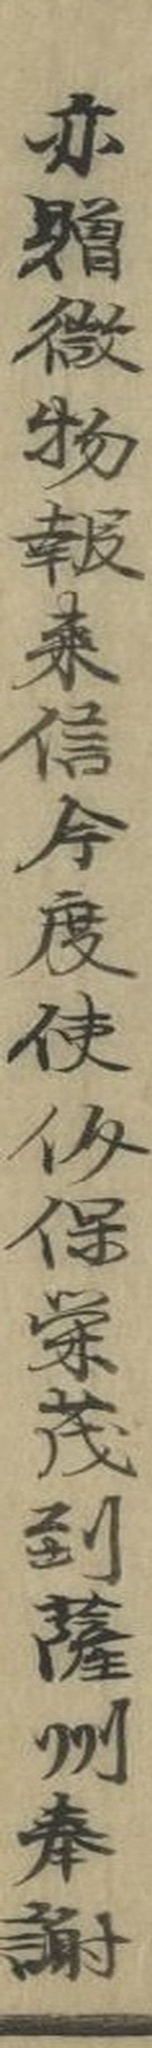亦贈徴物報来信今度使价保栄茂到薩州奉謝
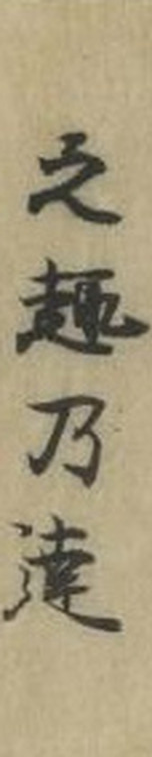之趣乃達
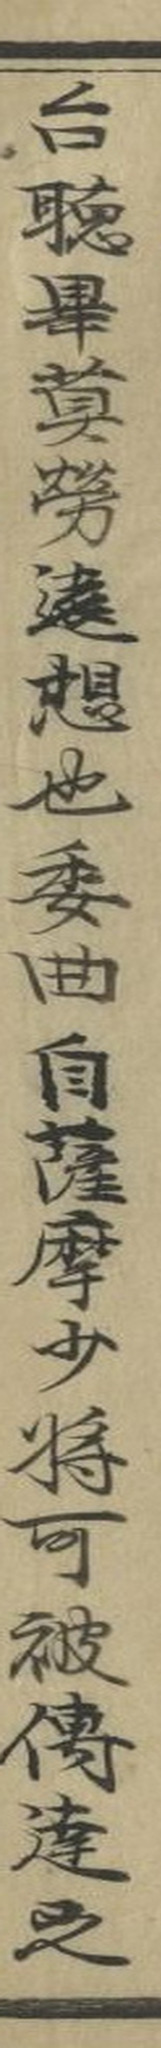台聴畢莫労違想也委曲自薩摩少将可被伝達之
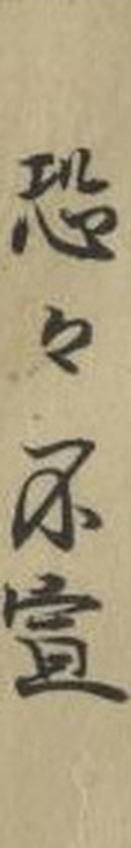恐々不宣

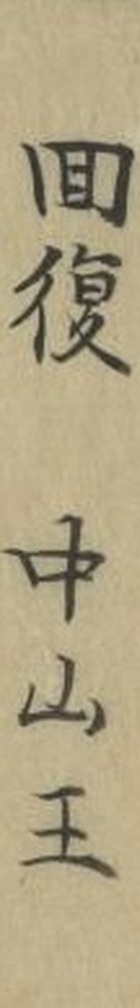回復中山王
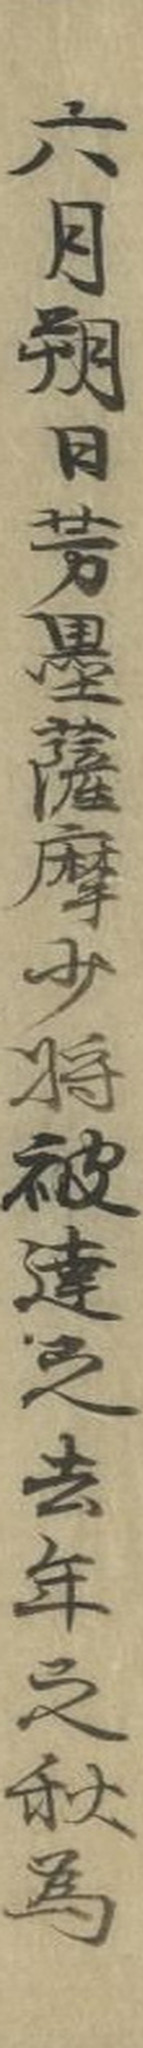六月朔日芳墨薩摩少将被達之去年之秋為
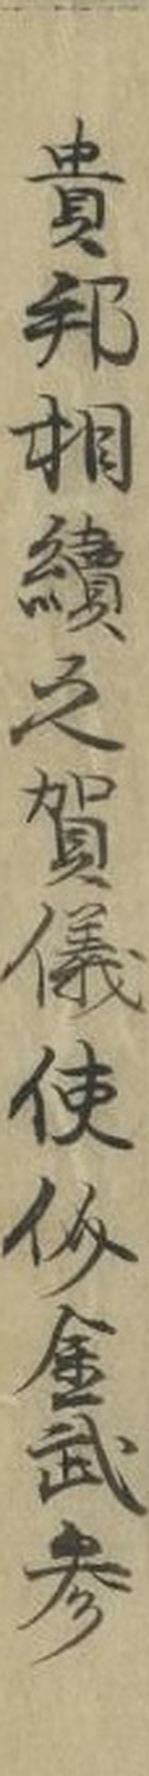貴邦相続之賀儀使价金武参
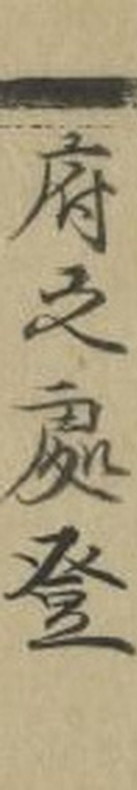府之處登
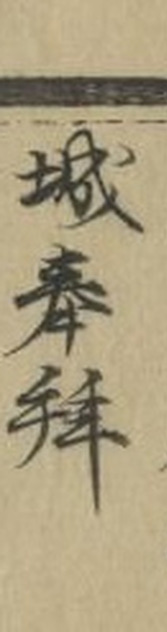城奉拝
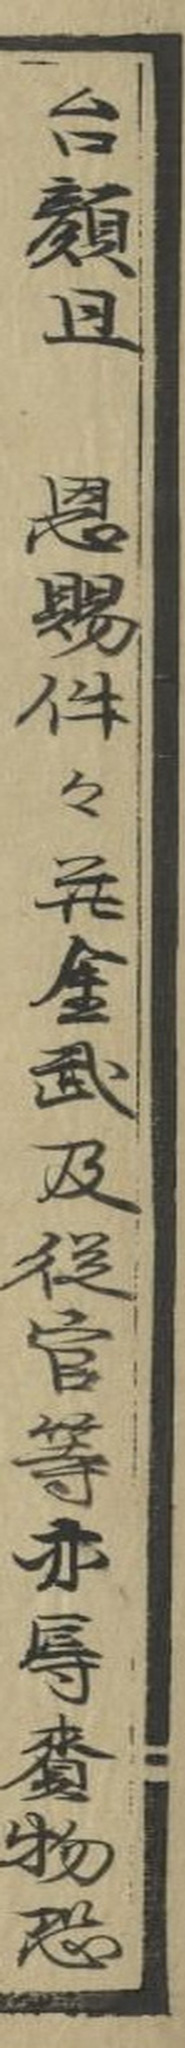台顔且恩賜件々并金武及従官等亦賓物恐
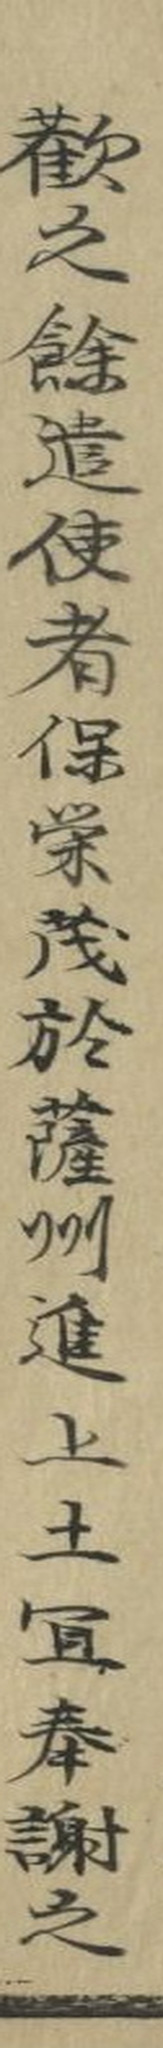歓之余遣使者保栄茂於薩州進上土冝奉謝之
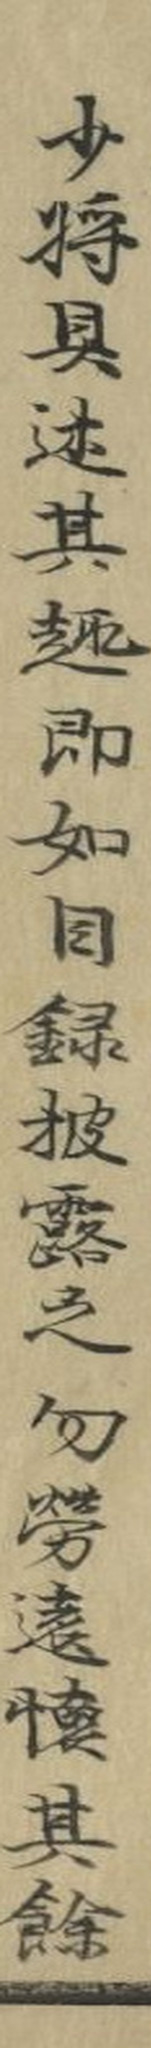少将具述其趣即如目録披露之勿労遠懐其余
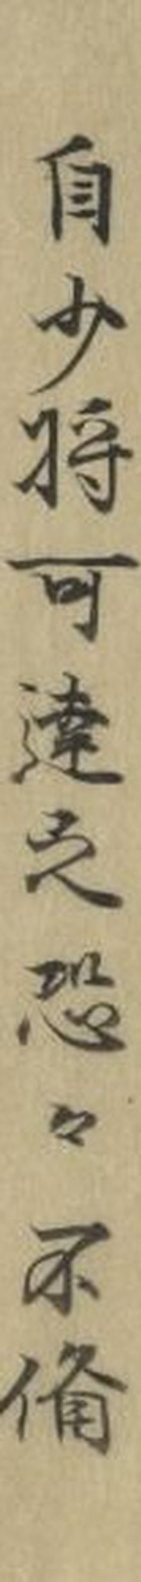自少将可達之恐々不備
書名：琉球往来（下）
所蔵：University of the Ryukyus Library
